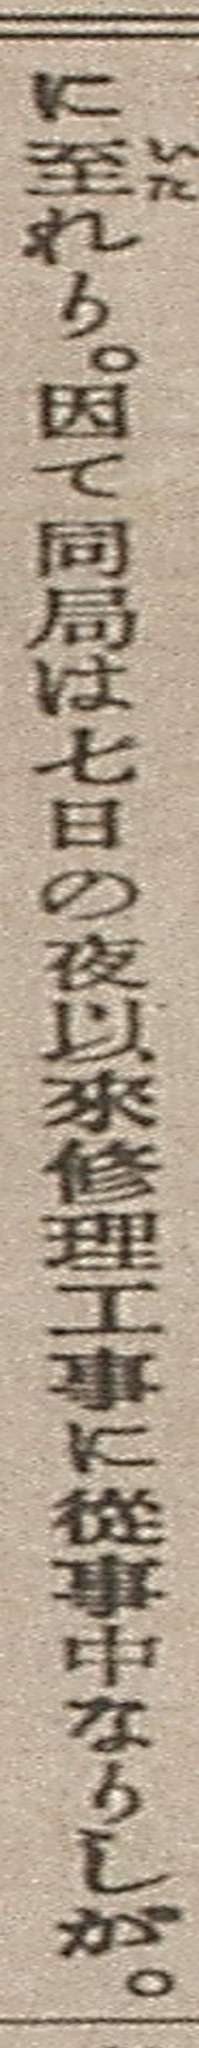に至れり。因て同局は七日の夜以来修理工事に従事中なりしが。
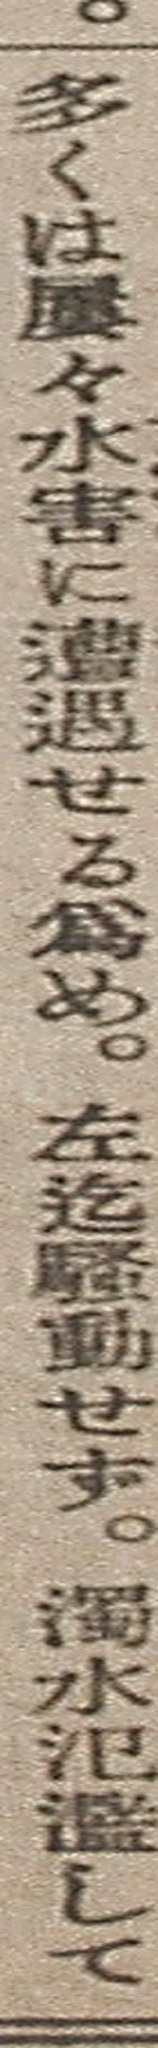多くは屢々水害に遭遇せる為め。左迄騒動せず。濁水氾濫して
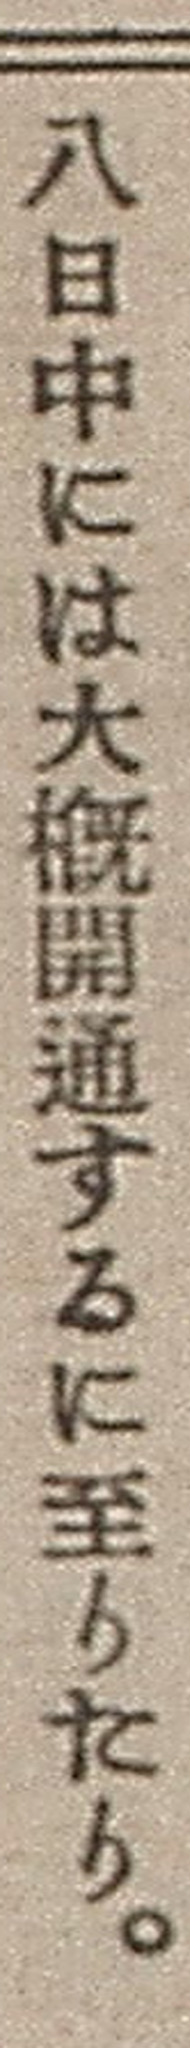八日中には大概開通するに至りたり。
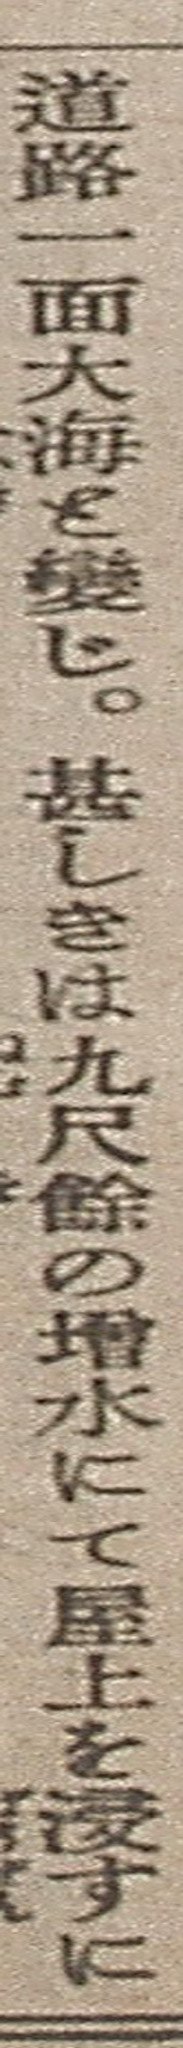道路一面大海と変じ。甚しきは九尺余の増水にて屋上を浸すに
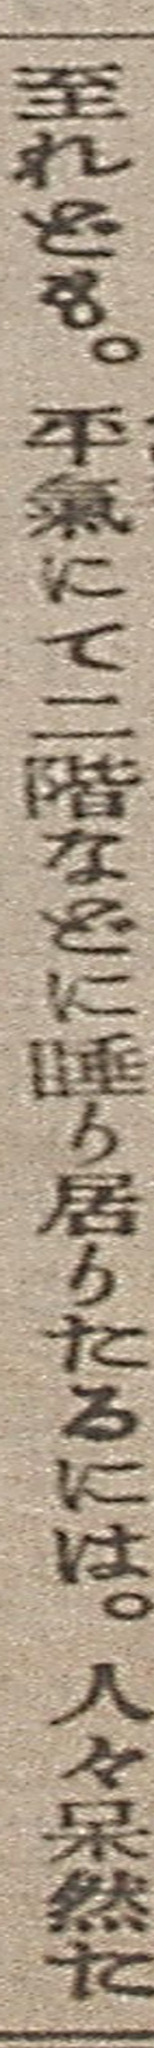至れども。平気にて二階などに睡り居りたるには。人々呆然た
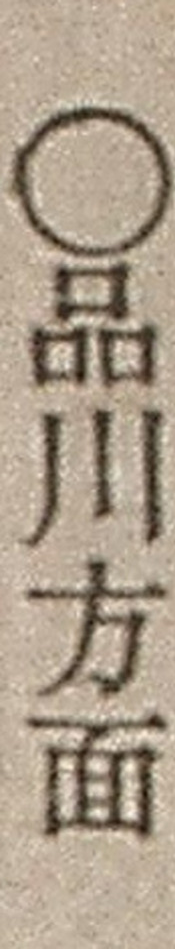〇品川方面
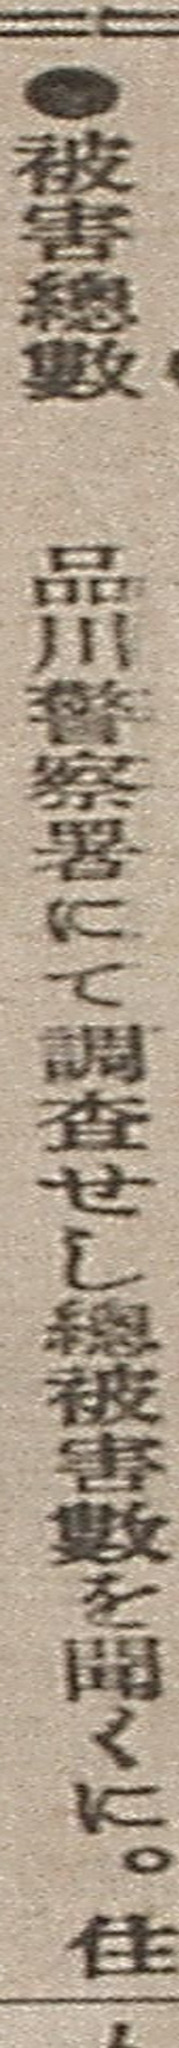●被害総数品川警察署にて調査せし総被害数を聞くに。住
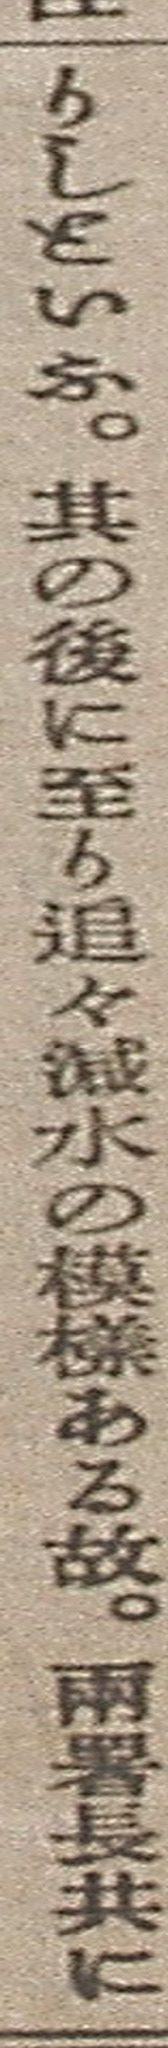りしといふ。其の後に至り追々減水の模様ある故。両署長共に
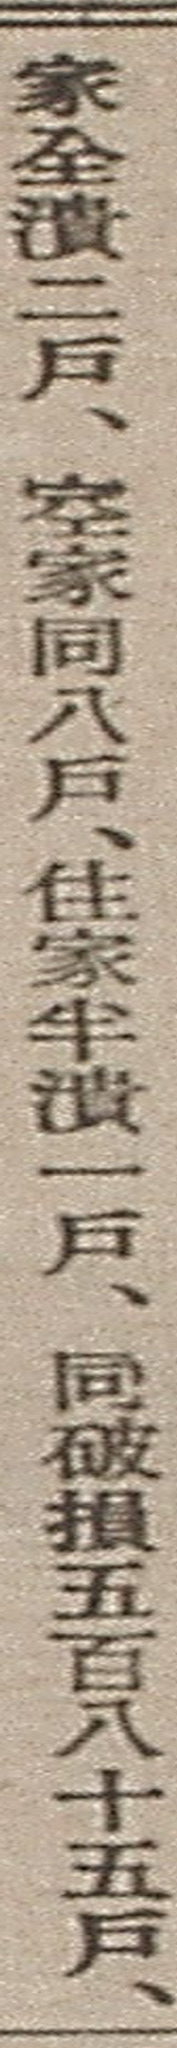家全潰二戸、空家同八戸、住家半潰一戸、同破損五百八十五戸、
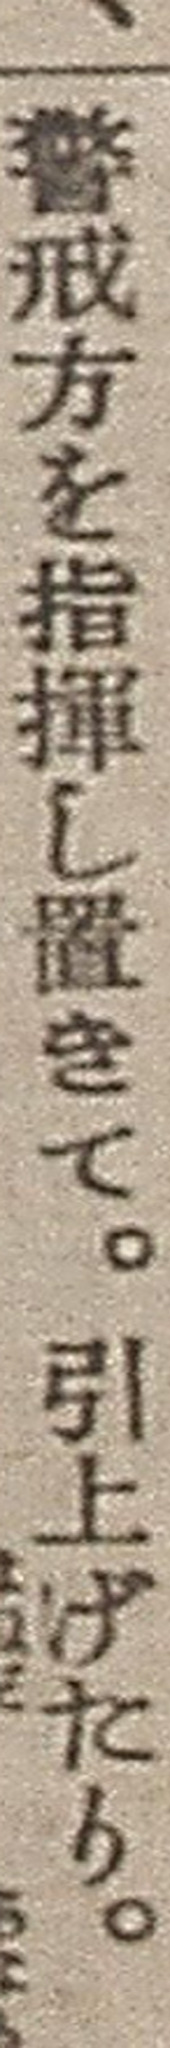警戒方を指揮し置きて。引上げたり。
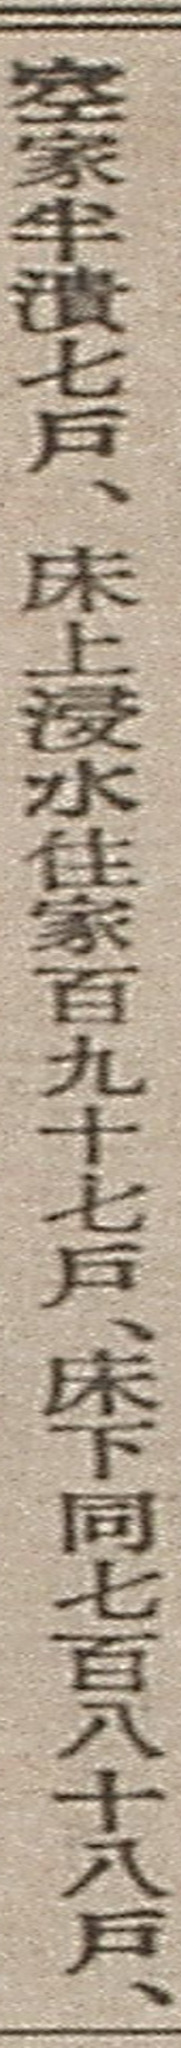空家半潰七戸、床上浸水住家百九十七戸、床下同七百八十八戸、
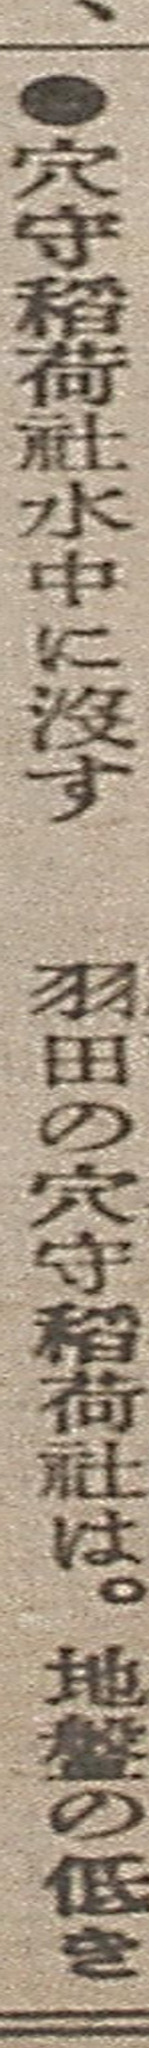●穴守稲荷社水中に没す羽田の穴守稲荷社は。地盤の低き
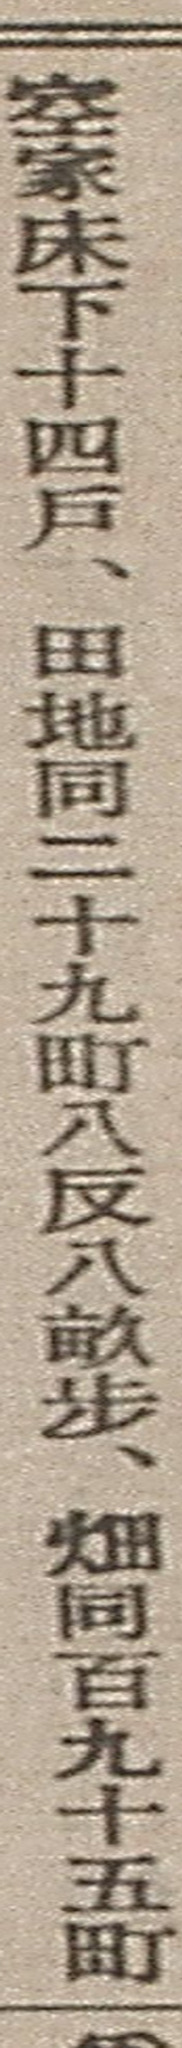空家床下十四戸、田地同二十九町八反八畝歩、畑同百九十五町
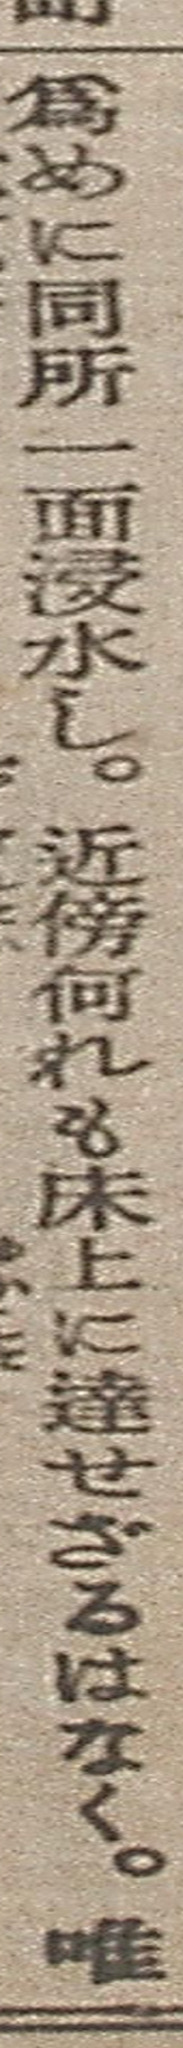為めに同所一面浸水し。近傍何れも床上に達せざるはなく。唯
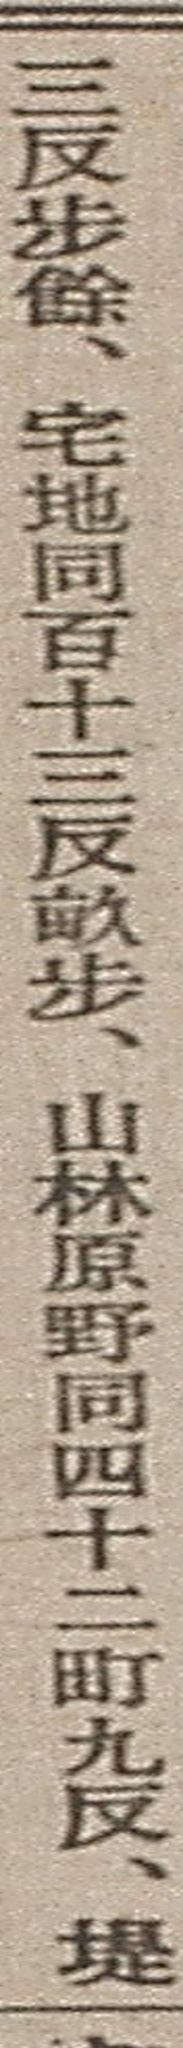三反歩余、宅地同百十三反畝歩、山林原野同四十二町九反、堤
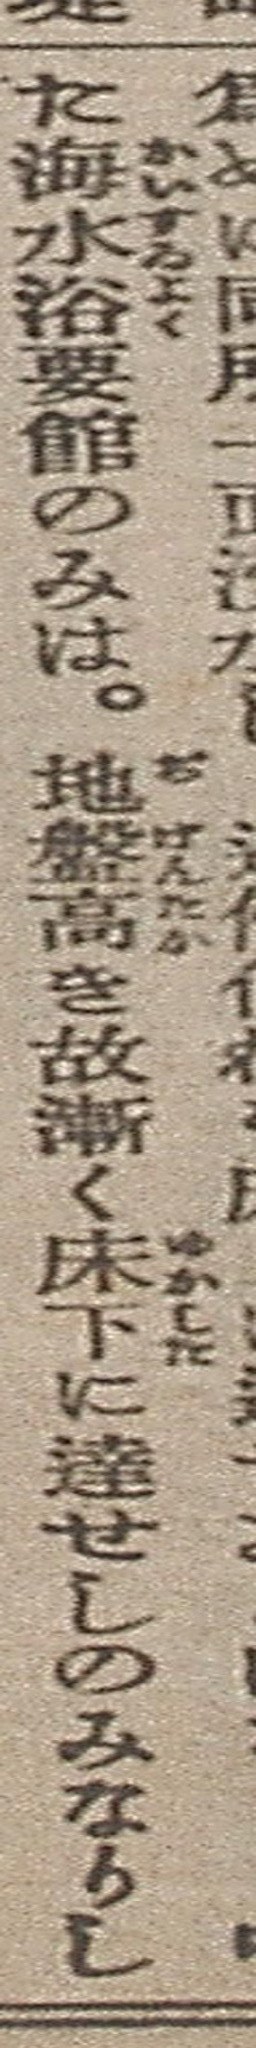た海水浴要館のみは。地盤高き故漸く床下に達せしのみなりし
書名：風俗畫報臨時増刊第百九十九號　明治三十二年十月各地災害圖會（前編之續）
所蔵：東京大学地震研究所図書室 Earthquake Research Institute Library, The University of Tokyo, JAPAN
